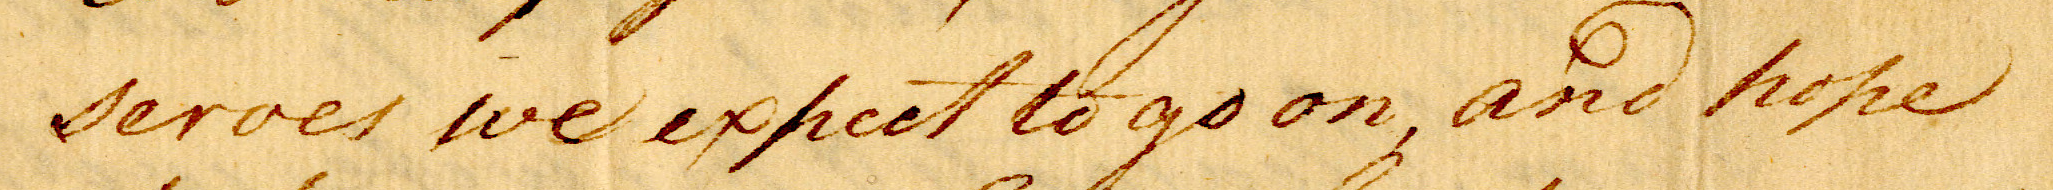serves we expect to go on, and hope
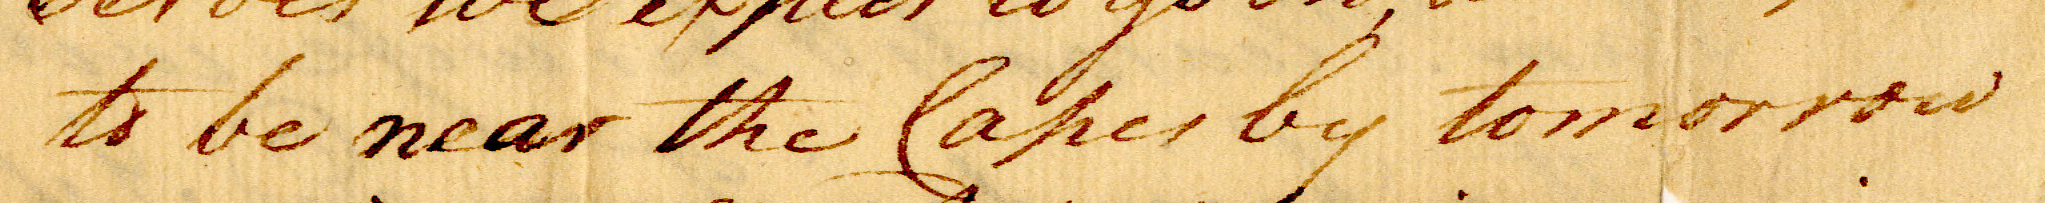to be near the Capes by tomorrow
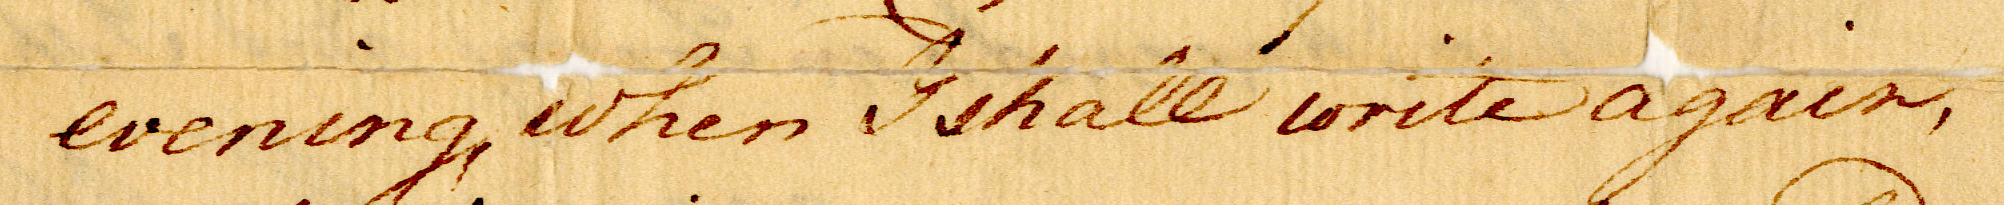evening, when I shall write again,
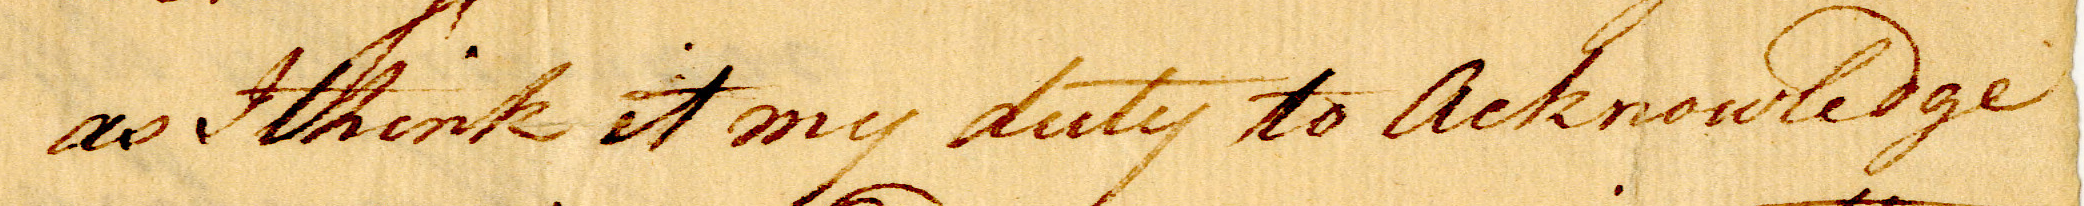as I think it my duty to acknowledge
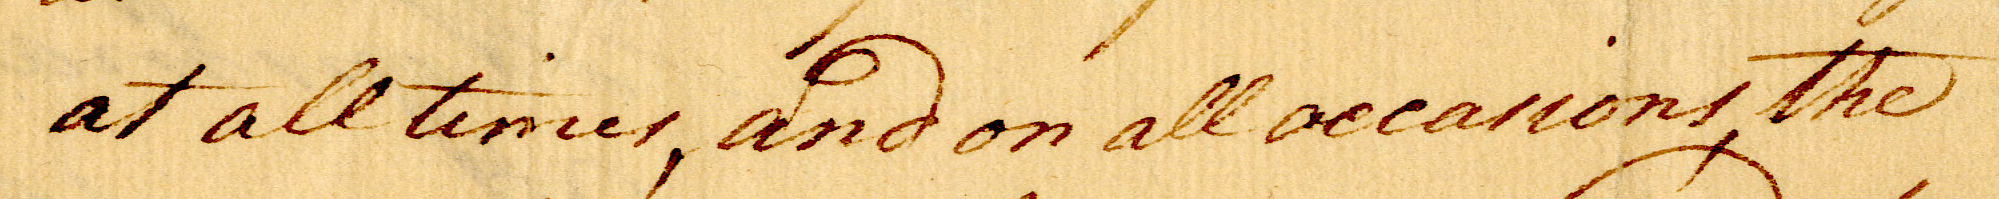at all times, and on all occasions, the
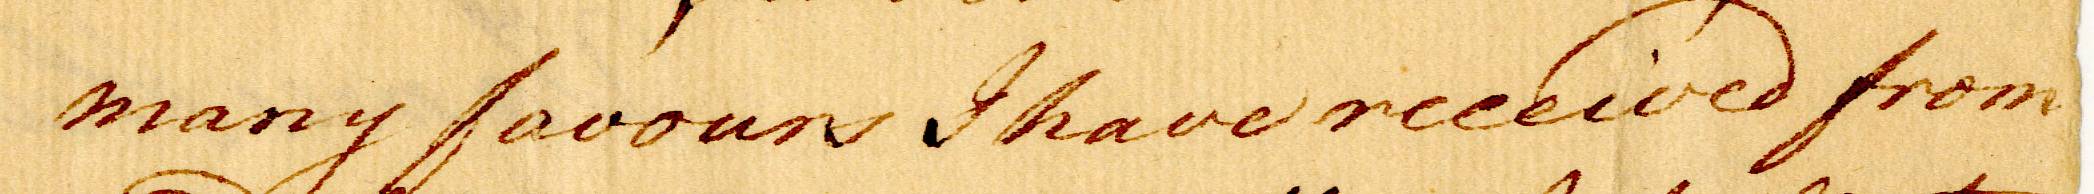many favours I have received from
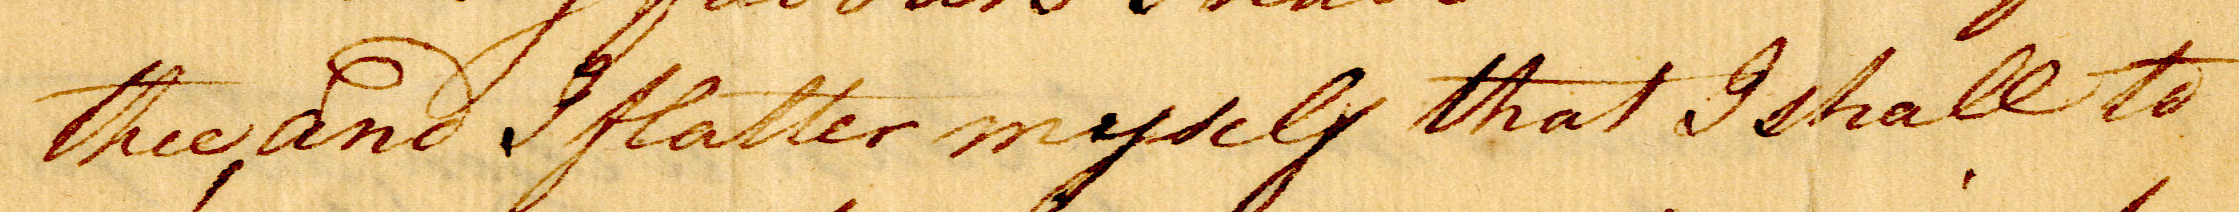thee, and I flatter myself that I shall to
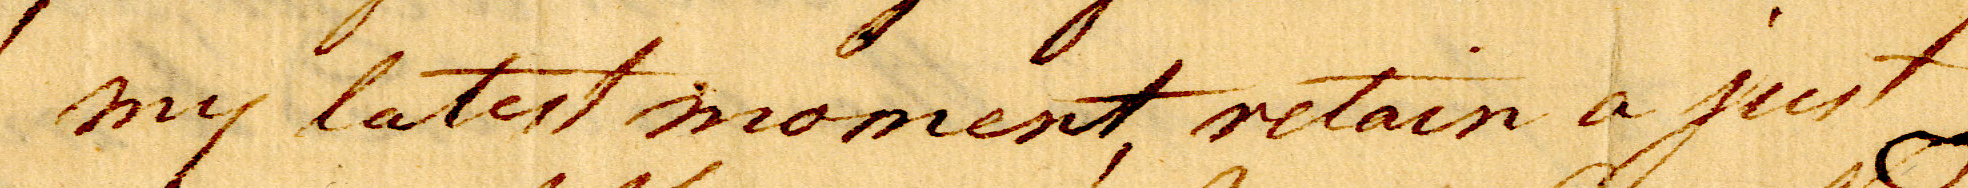my latest moment, retain a just
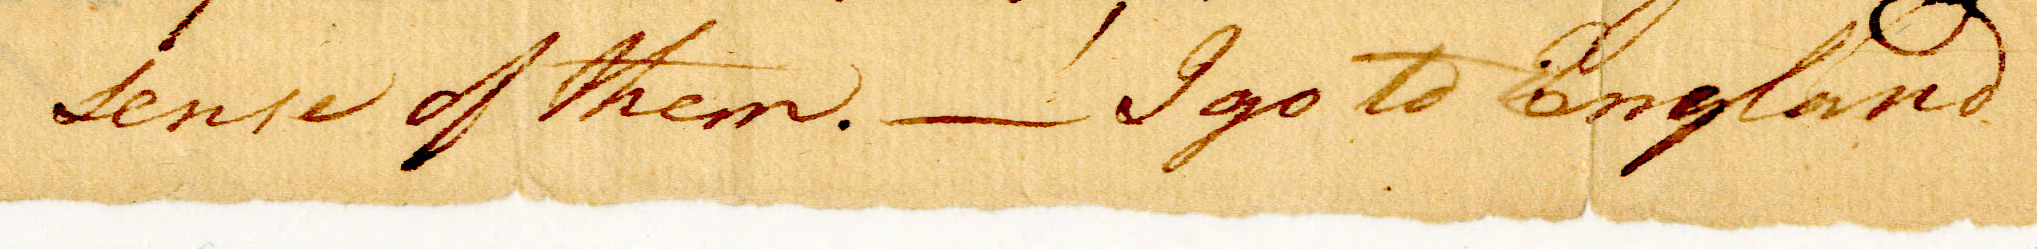sense of them.- I go to England
